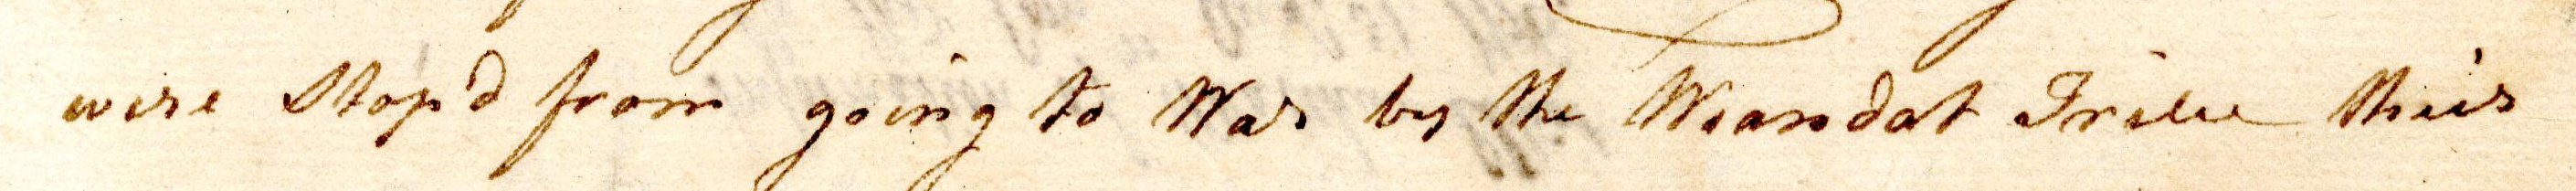were stop'd from going to War by the Wiandat Tribe their
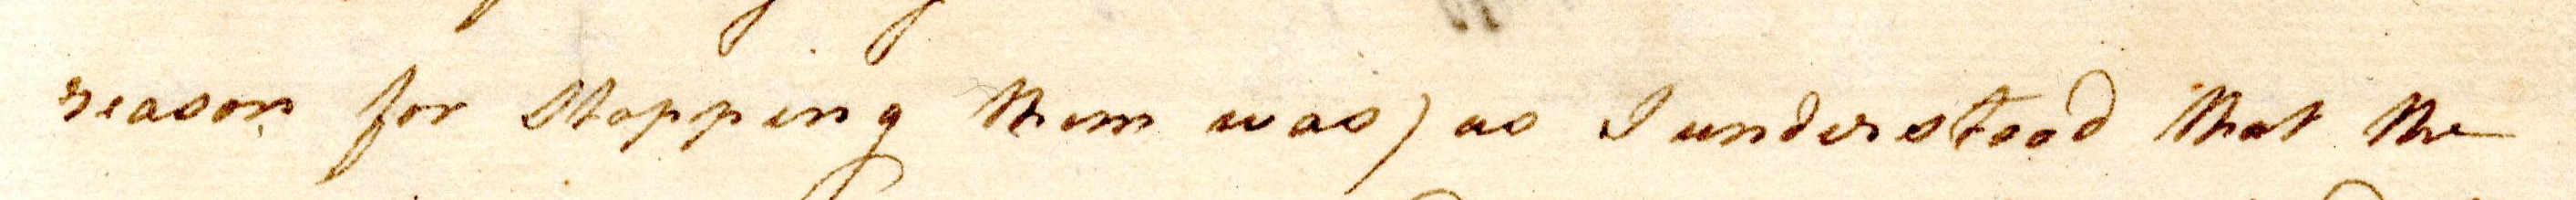reason for Stopping them was, as I understood that the
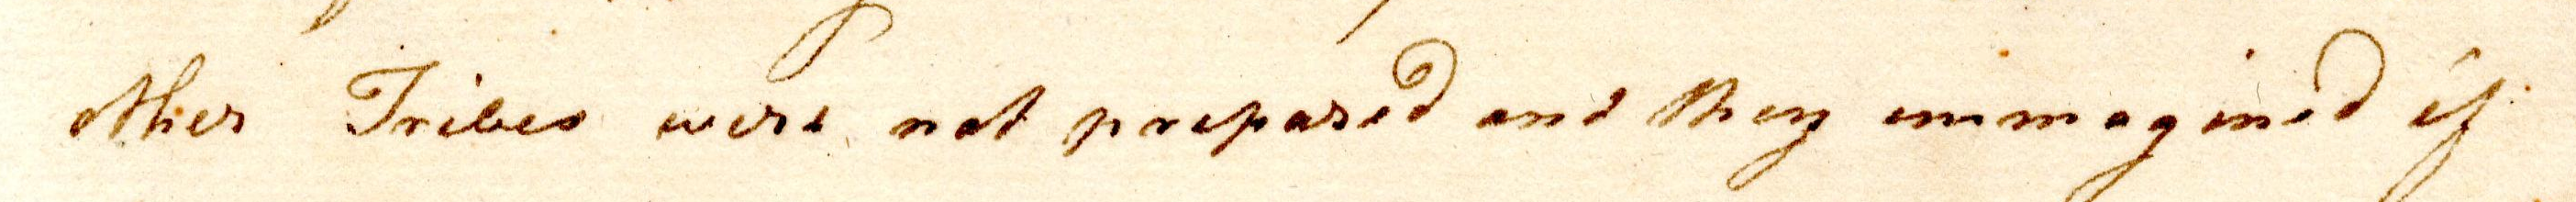other Tribes were not prepared and they immagined if
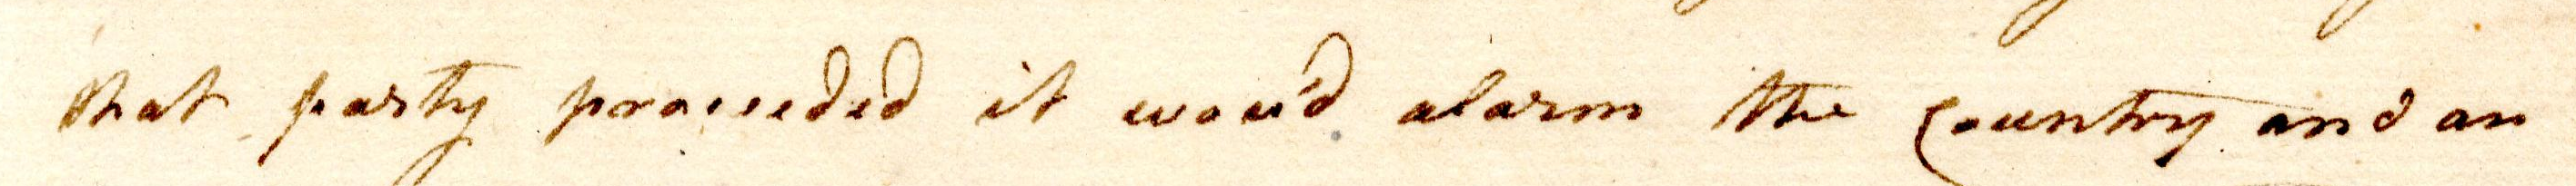that party proceeded it wou'd alarm the Country and an
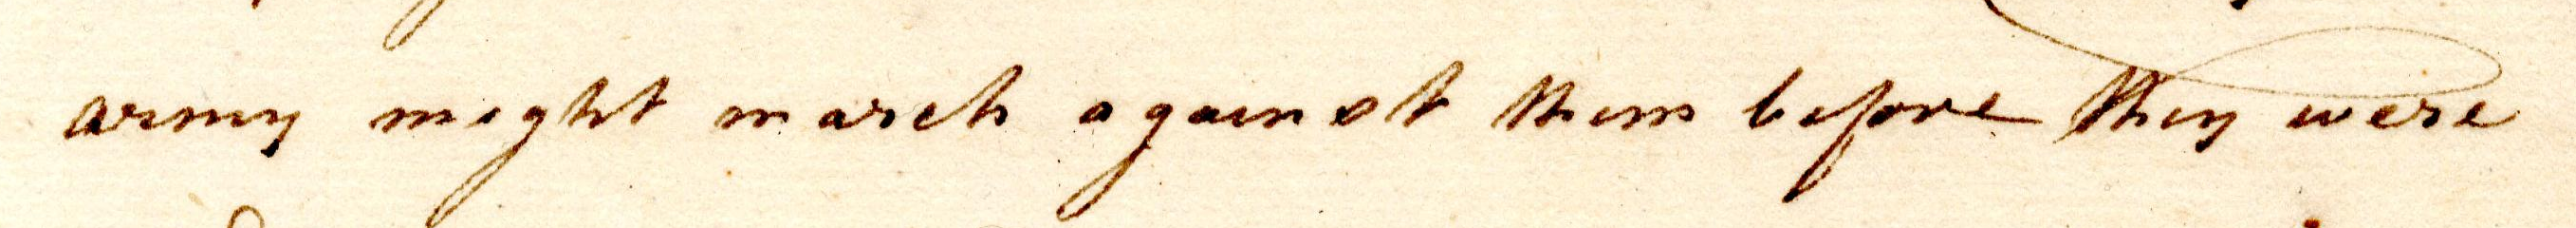army might march against them before they were
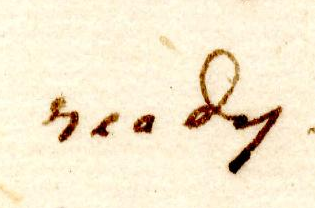ready-
